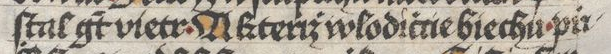ſtal ḡt vietr.A kteṙiż wlodiċcie bíechu.pṙi¬
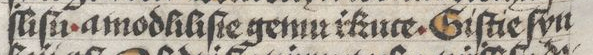ẛli ſu.a modlili ſie gemu ṙkuce.Giſtie ſyn
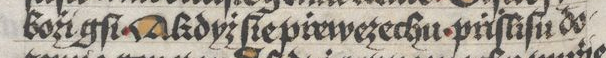bożi gſi.A kdyż ſie pṙewezechu.pṙiſli ſu do¬
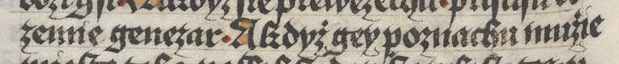zemie genezar.Akdyż gey poznachu mużie
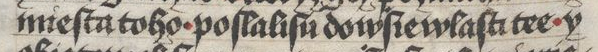mieſta toho.poſlaliſu do wẛie wlaſti tee.y
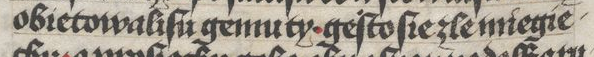obietowaliſu gemu ty.geẛto ſie zle miegíe¬
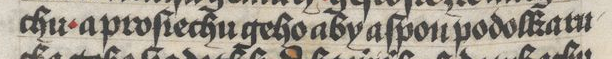chu.a proſiechu geho aby aſpon podolkaru¬
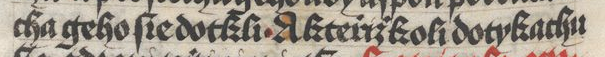cha geho ſie dotkli.A kteṙíż koli dotykachu
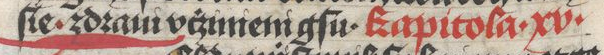ſie.zdraui ucżinieni gſu.kapitola.xv.
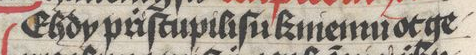Ehdy pṙiſtupili ſu kniemu ot ge¬
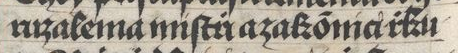ruzalema miſtṙi a zakōnici ṙku¬
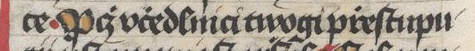ce.Ꝓcż vċedlnici twogi pṙeſtupu¬
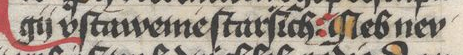gíj vſtaweníe ſtarẛích?Neb nev¬
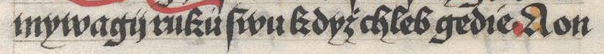mywagij ruku ſwu kdyż chleb gedíe.A on¬
